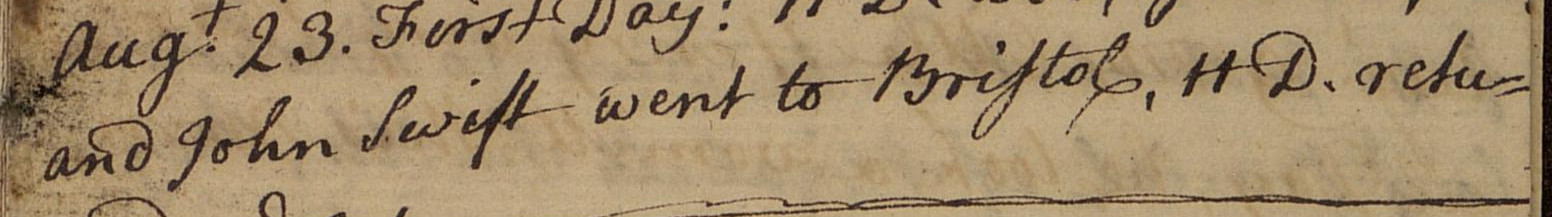and John Swift went to Bristol, HD. retu-
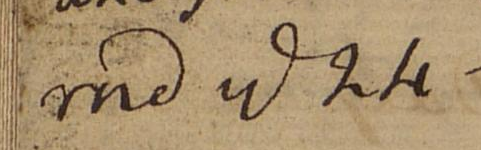rned y^e 24
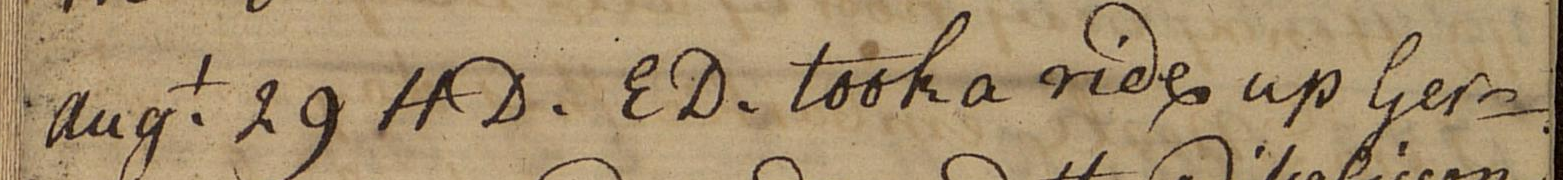Aug^t. 29 HD. ED. took a ride up Ger-
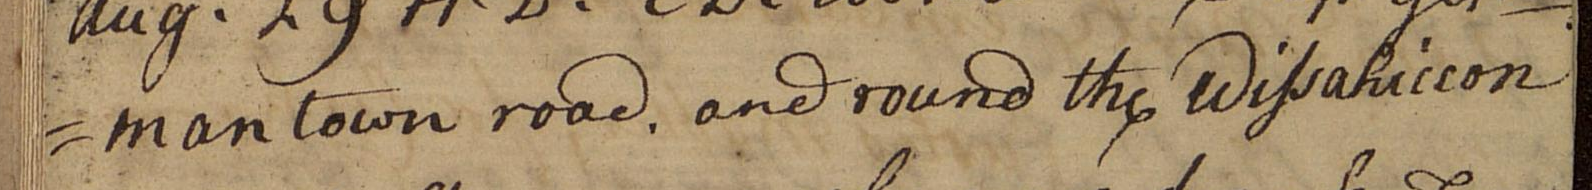-mantown road, and round the Wissasiccon
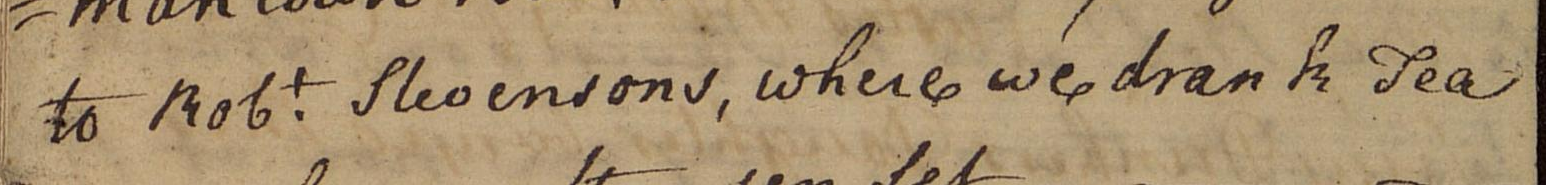to Rob^t. Stevensons, where we drank Tea
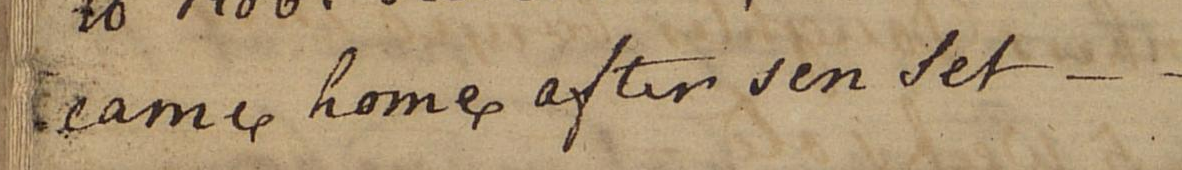came home after sun set-
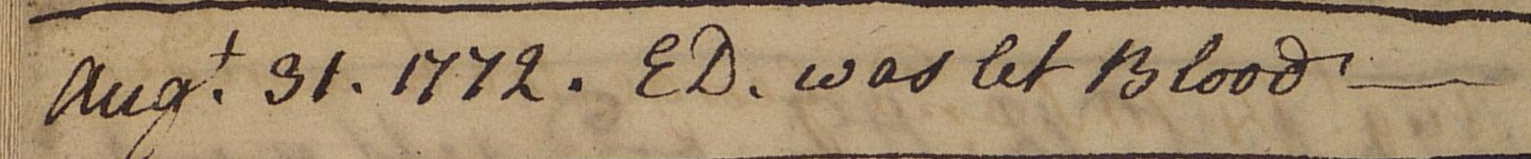Aug^t. 31. 1772. ED. was let Blood-
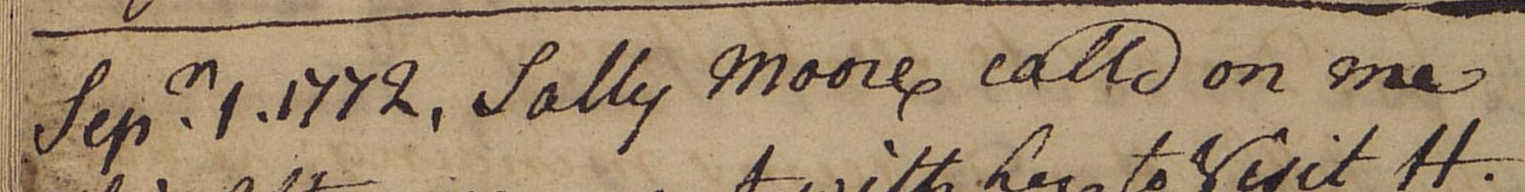Sep^m. 1. 1772, Sally Moore calld on me
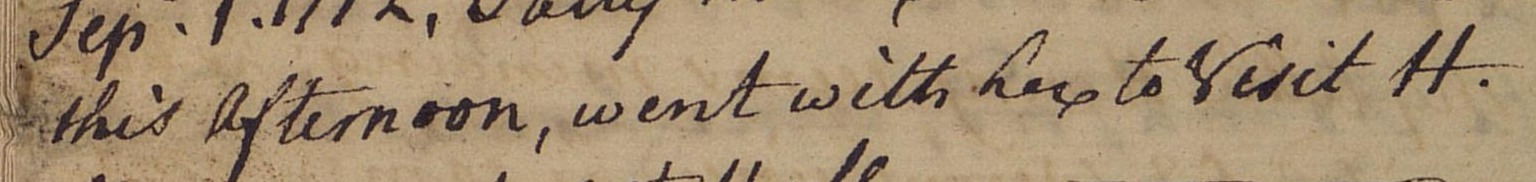this Afternoon, went with her to Visit H.
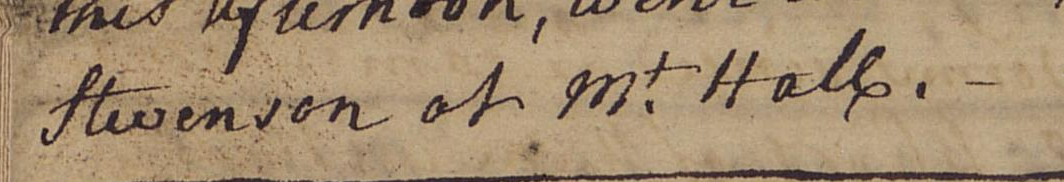Stevenson at M^t. Hall.-
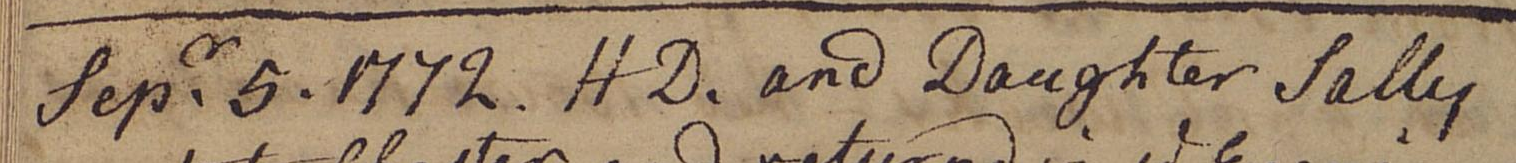Sep^m. 5. 1772. HD. and Daughter Sally
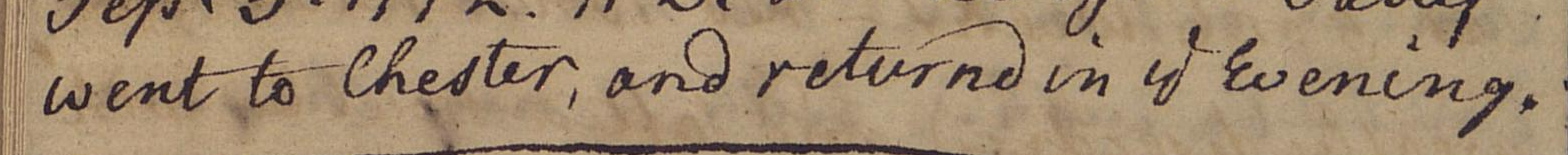went to Chester, and returnd in y^e Evening,
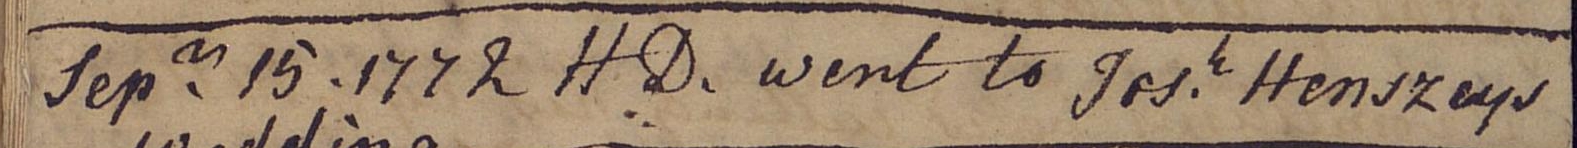Sep^m. 15. 1772 HD. went to Jos^h. Henszays
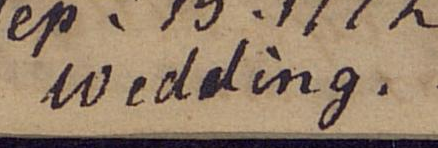Wedding.
